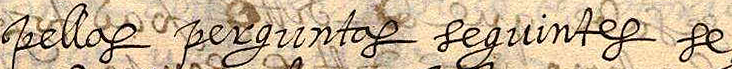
pellas perguntas seguintes se
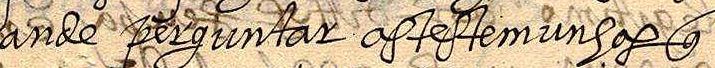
ande perguntar as testemunhas q̄
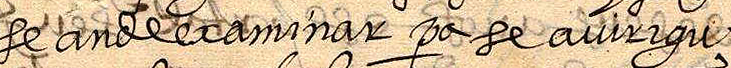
se ande examinar ꝑa se auirigu
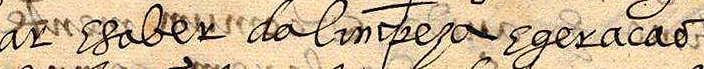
ar E saber da limpeza E geracaõ
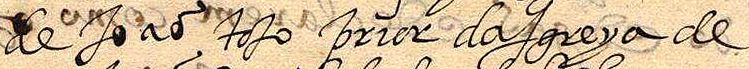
de Joaõ tojo prior da Jgreya de
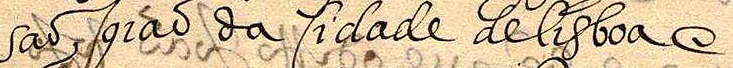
saõ giaõ da Cidade de lisboa e
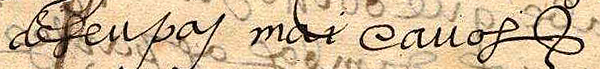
de seu paj mai e auos
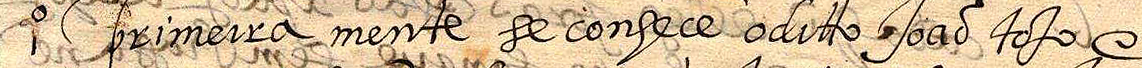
1o primeiramente se conhecē o ditto Joaõ tojo e
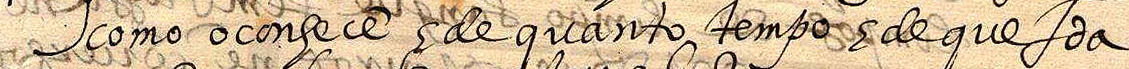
como o conhecē E de quanto tempo E de que Jda
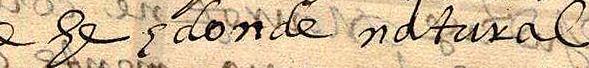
de he E donde natural
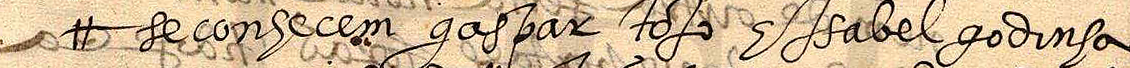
item se conhecem gaspar tojo E Jsabel godinha
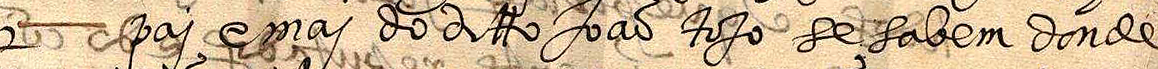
2 paj e maj do ditto Joaõ tojo se sabem donde
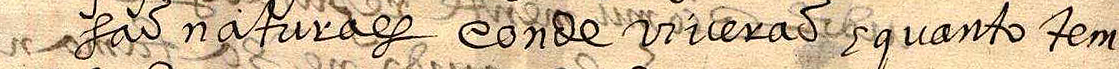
saõ naturaes e onde viueraõ E quanto tem
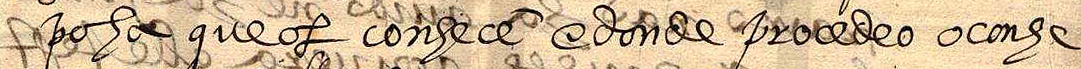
po ha que os conhecē e donde procedeo o conhe
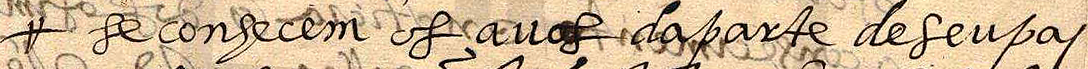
item se conhecem os auos da parte de seu paj
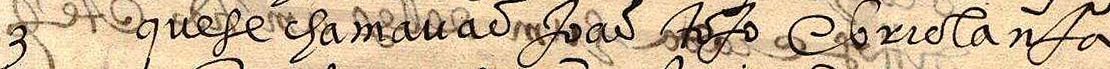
3 que se chamauaõ Joaõ tojo e briolanJa
